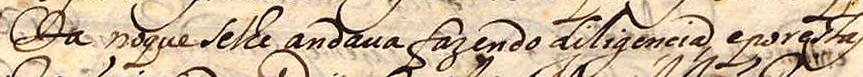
ta no que se lhe andaua fazendo diligencia, e por estas
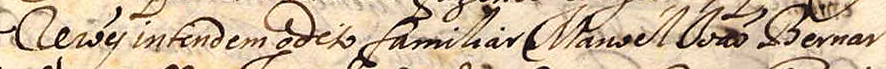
Rezões intendem o dito familiar Manoel Ioaõ Bernar
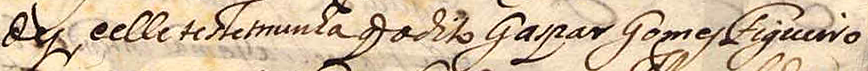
des e elle testemunha q̄ o dito Gaspar Gomes Figueiro
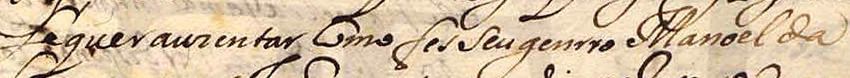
se quer auzentar como fes seu genrro Manoel da
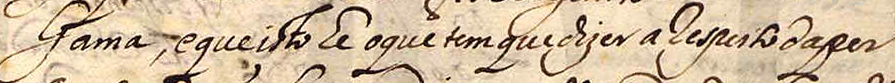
Gama, e que isto he o que tem que dizer a Respeito da per
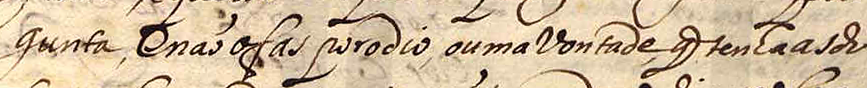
gunta, e naõ o fas por odio, ou ma vontade, q̄ tenha as di
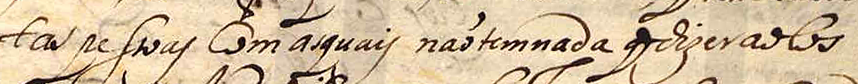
tas pessoas com as quais naõ tem nada q̄ dizer ao cos
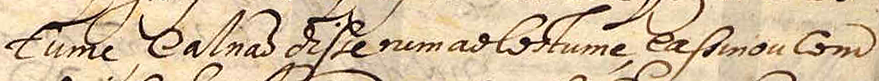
tume, E al naõ disse nem ao costume, e assinou com
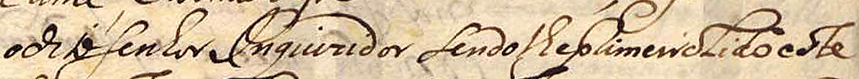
o dito senhor Inquizidor sendolhe primeiro Lido este
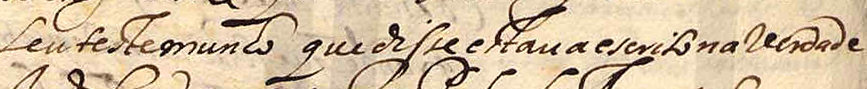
seu testemunho que disse estaua escrito na verdade
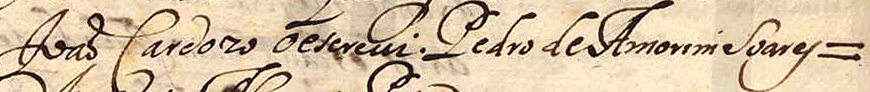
Joaõ Cardozo o escreui. Pedro de Amorim Soares =
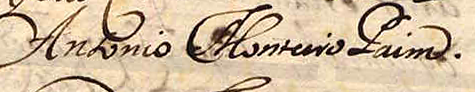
Antonio Monteiro Paim.
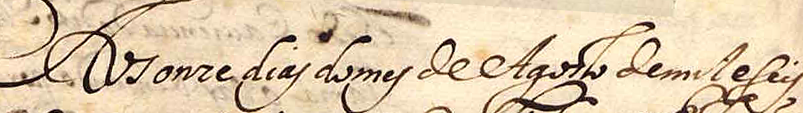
Aos onze dias do mes de Agosto de mil e seis
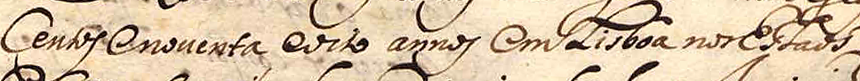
Centos e nouenta e oito annos em Lisboa nos Estaos
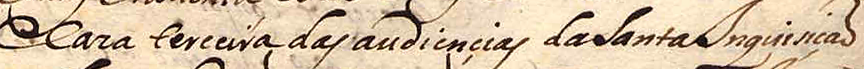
E caza terceira das audiencias da Santa Inquisiçaõ
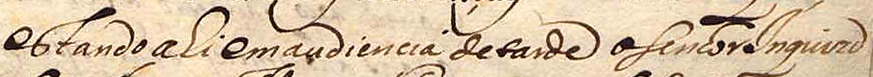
estando ahi em audiencia de tarde o senhor Inquizi
